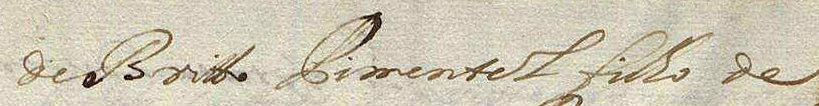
de Britto Pimentel filho de
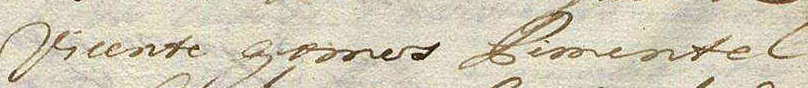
Vicente gomes Pimentel
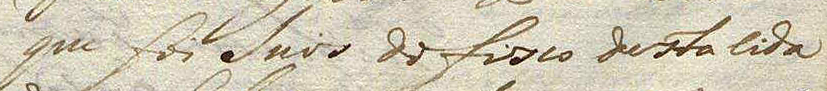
que foi Iuis do fisco desta cida
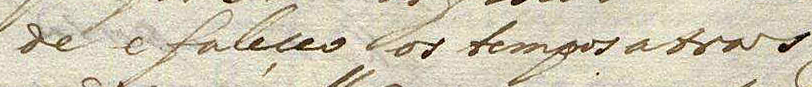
de e faleceo os tempos atras
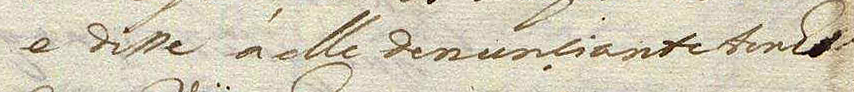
e disse a elle denunciante tinha
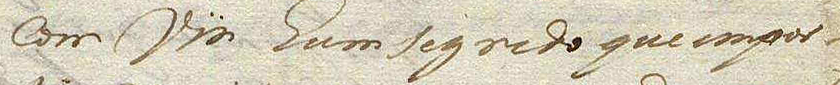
com Vm hum segredo que impor
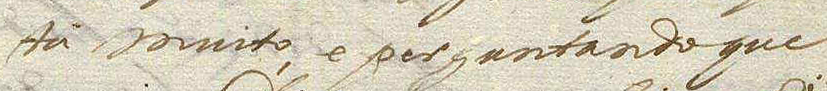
ta muito, e perguntando que
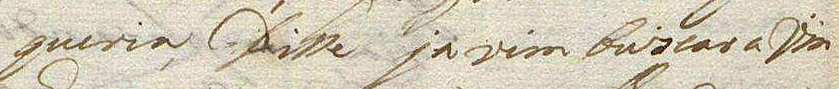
queria, Disse ja vim buscar a Vm
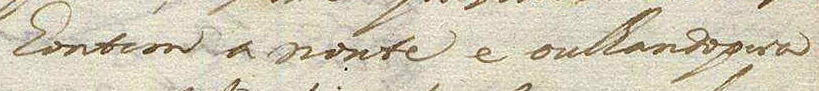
hontem a noute e oulhando pera
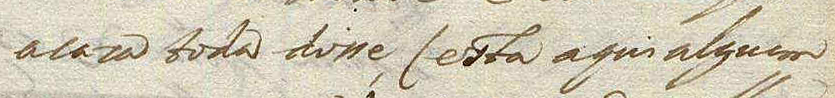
a caza toda disse, (esta aqui alguem
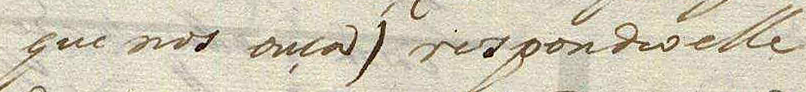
que nos ouça) respondeo elle
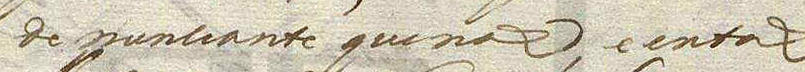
denunciante que naõ, e entaõ
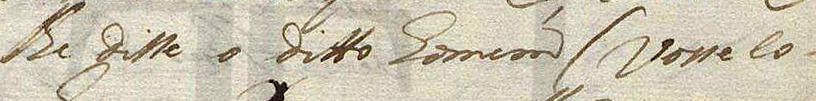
lhe disse o ditto homem (Vosse co
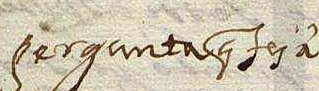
pergunta q̄ fes á
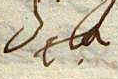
t.a
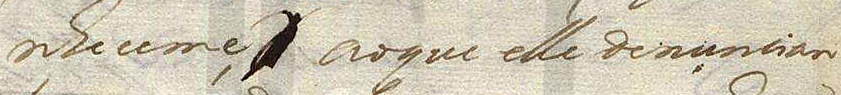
nheceme,) ao que elle denuncian
